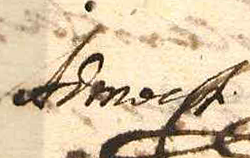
Admoest.
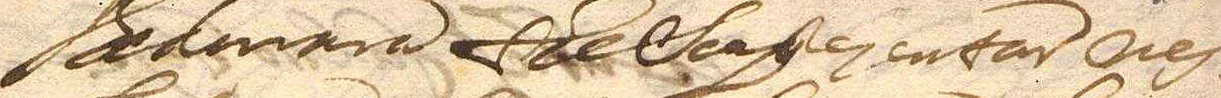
lhe durara the se aprezentar nes
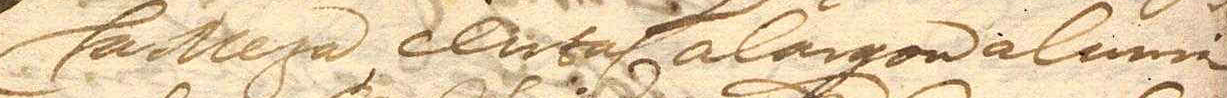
ta Meza, e entaõ a largou alumi
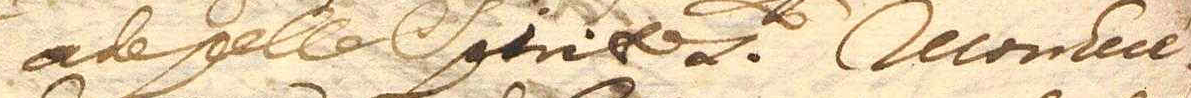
ada pello Spirito s.to Reconhece
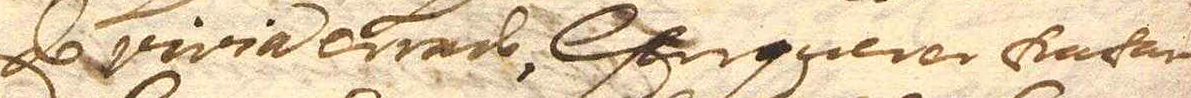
do vivia errado, e por querer tratar
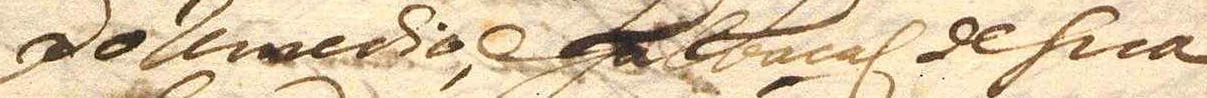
do Remedio, e salvaçaõ de sua
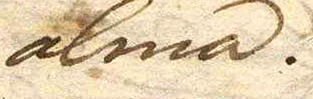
alma.
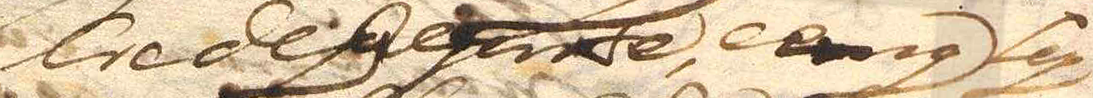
cre de presente, e em q̄ ley
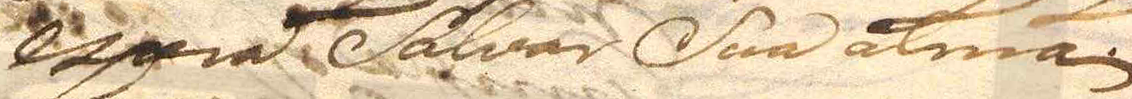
espera Salvar Sua alma.
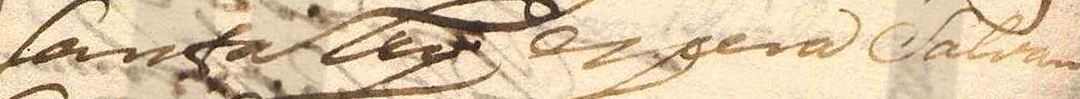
santa Ley ezpera Salvar
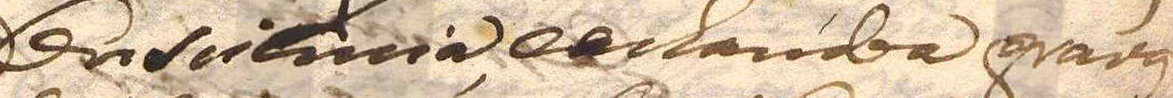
Consciencia, e achandoa grava
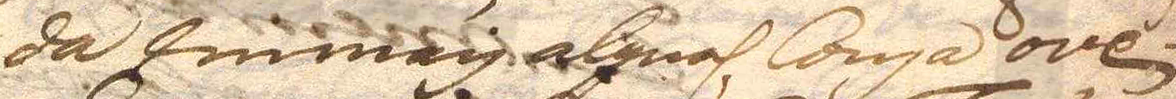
da em mais alguā Couza o ve
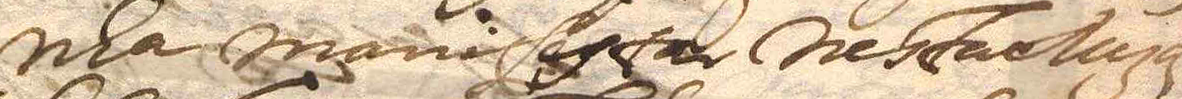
nha manifestar nesta Meza
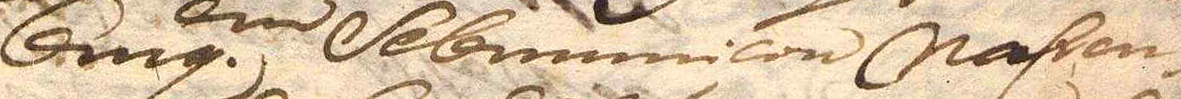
Com q.em Se comunicou na Cren
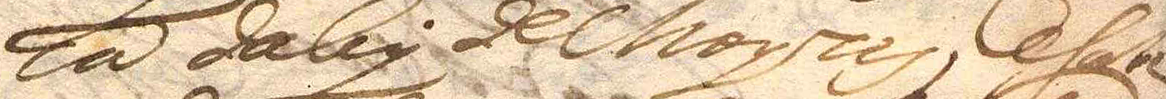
ça da ley de Moyzes, e sabe
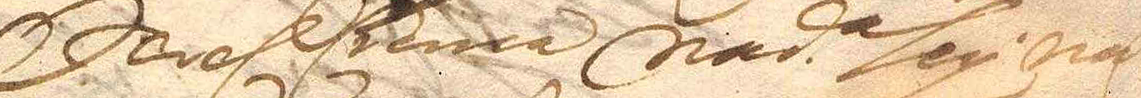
e terē Crença na d.a Ley nā
